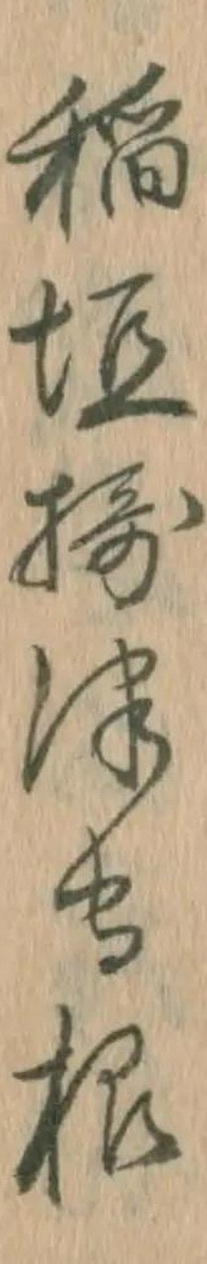稲垣摂津守様
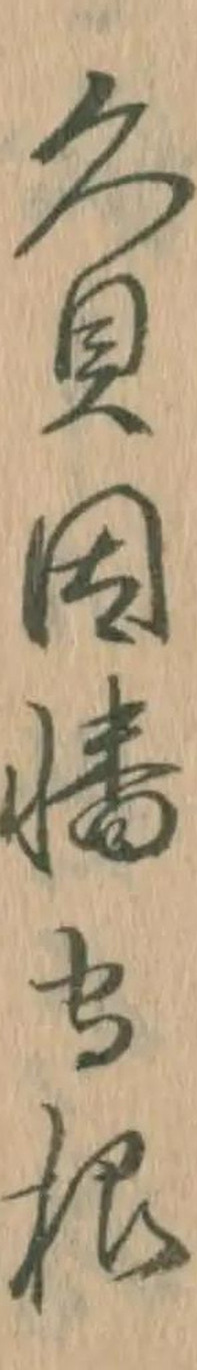久貝因幡守様
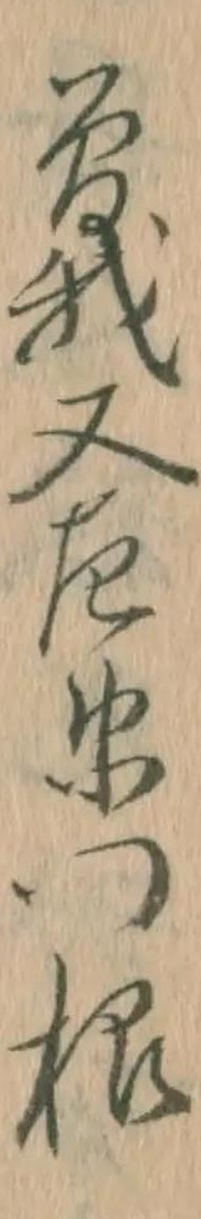曽我又左衛門様
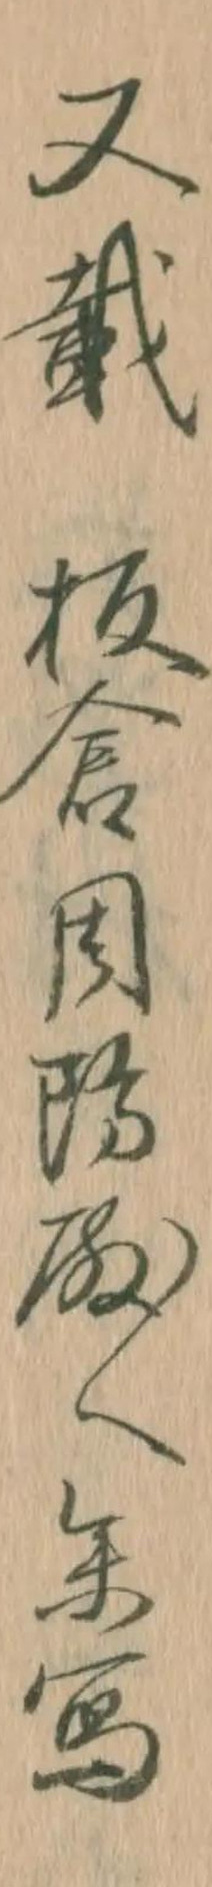又載板倉周防殿へ参寫
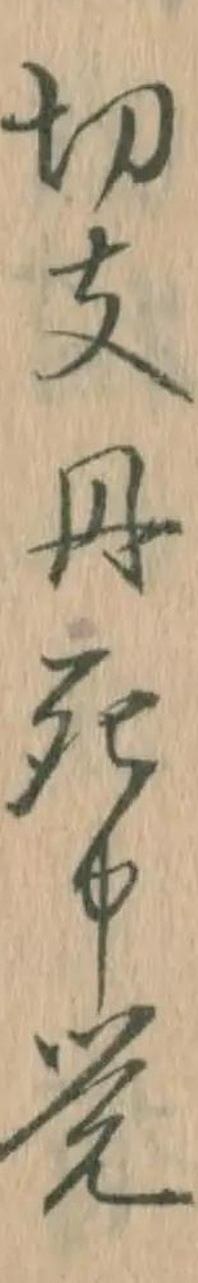切支丹死申覚
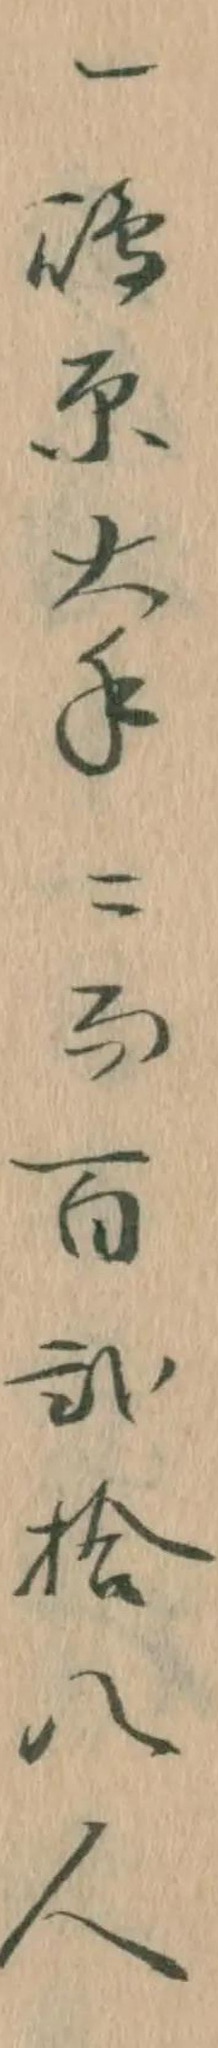一島原大手に而百弐拾八人
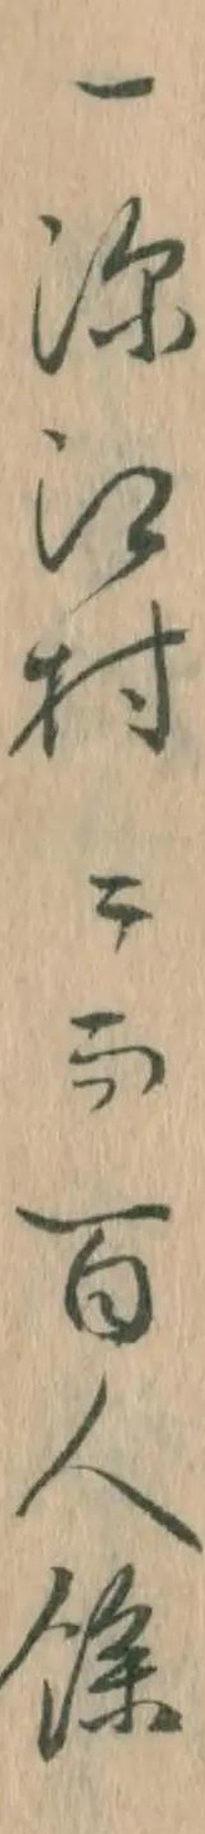一深江村に而百人余
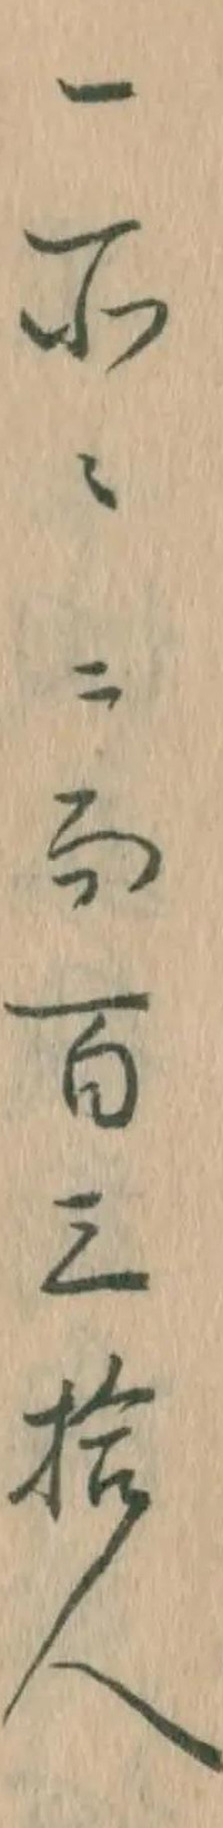一所々に而百三拾人
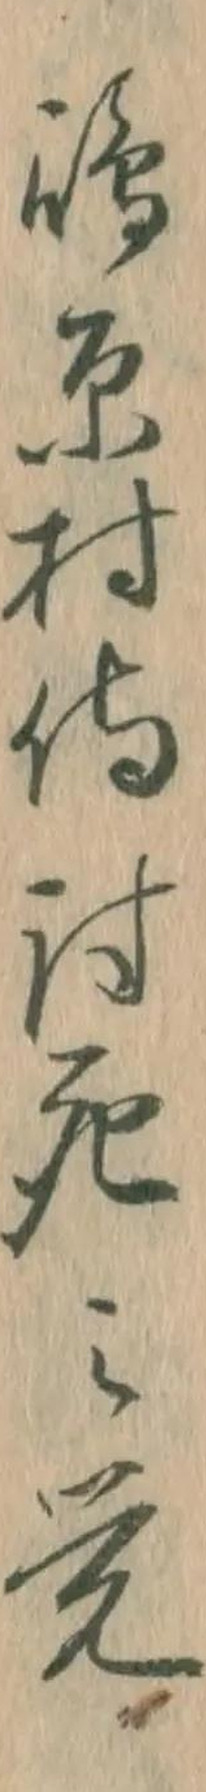島原村侍討死之覚
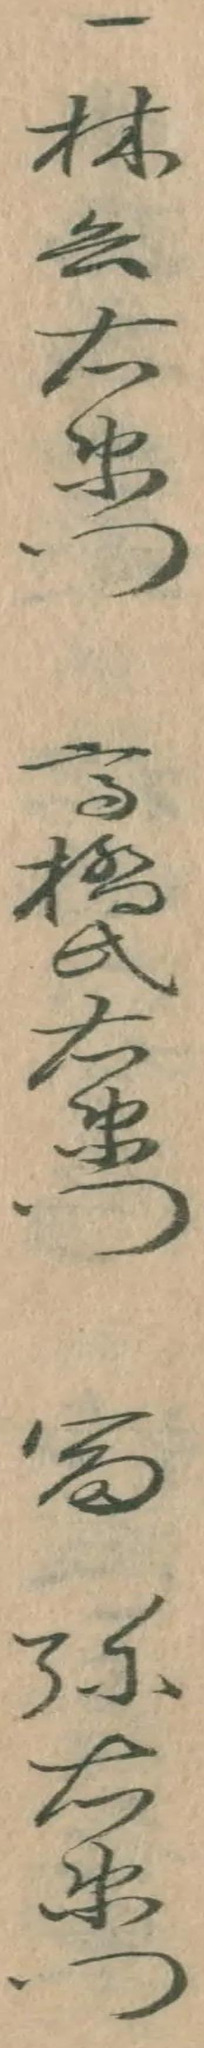一林兵右衛門高橋氏右衛門冨弥右衛門
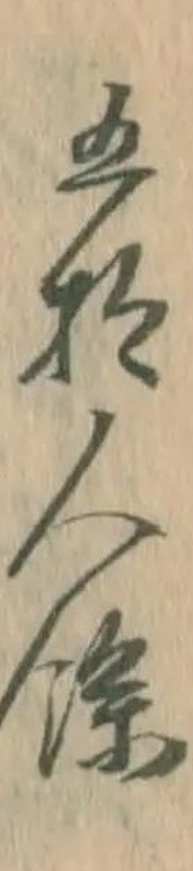五拾人余

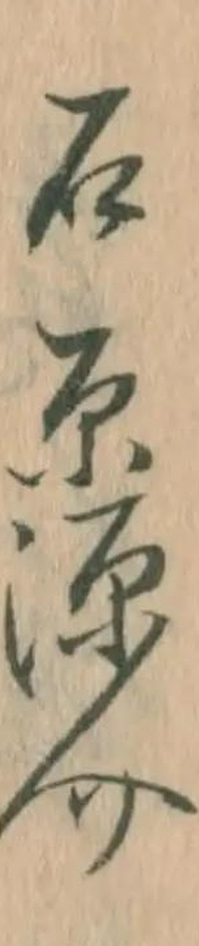石原源介
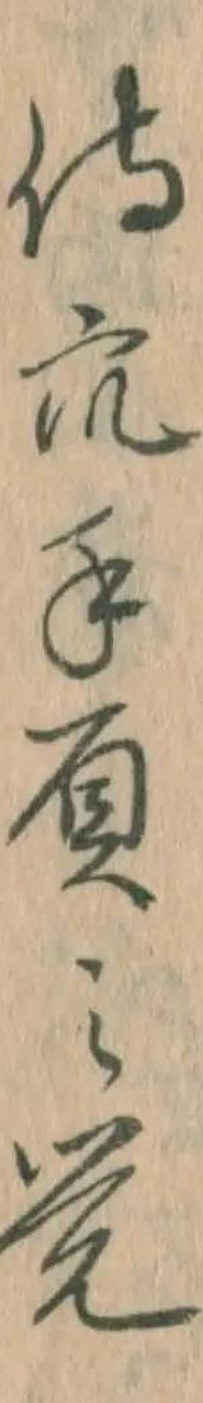侍衆手負之覚
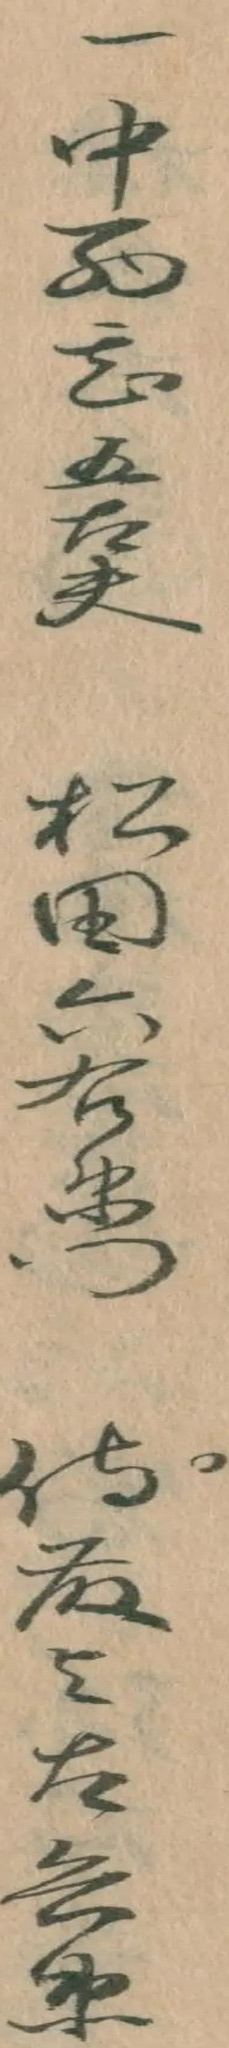一中西甚五太夫松田六右衛門備藤与太兵衛
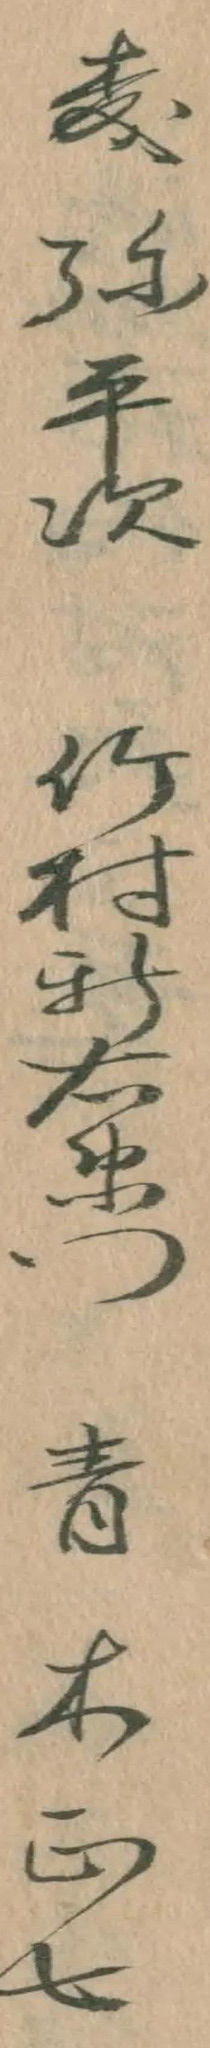森弥平次竹村新右衛門青木正七
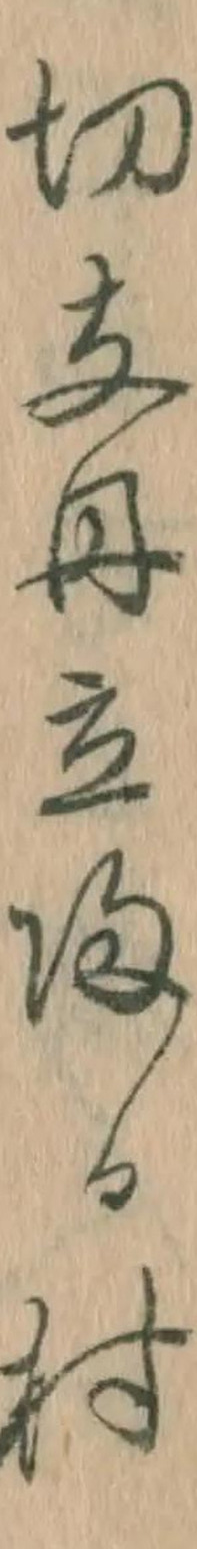切支丹立帰る村
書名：切支丹御退治記 49巻. [4]
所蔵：国立国会図書館 National Diet Library, JAPAN
